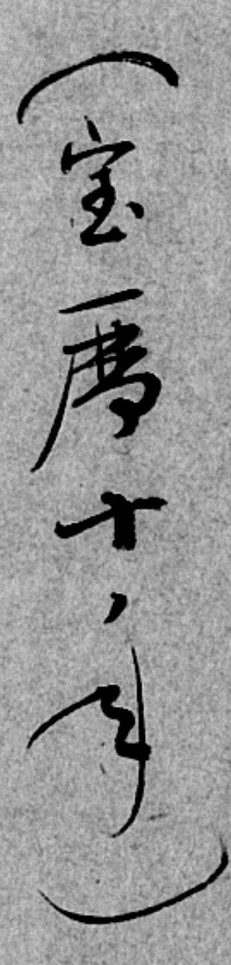(宝暦十年)
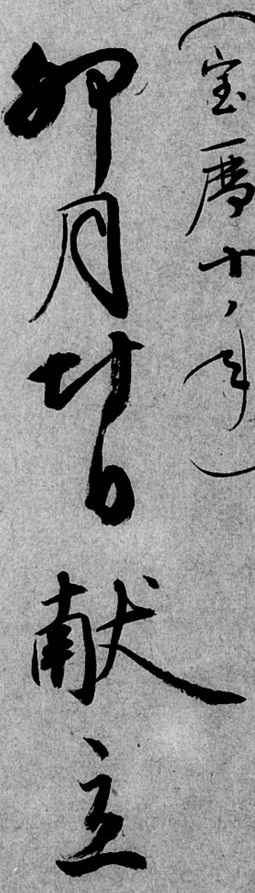卯月甘日献立

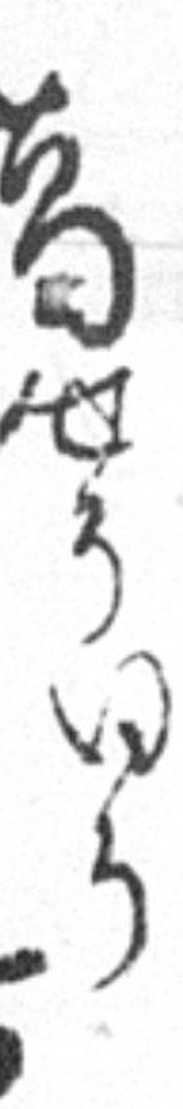葛せうゆう
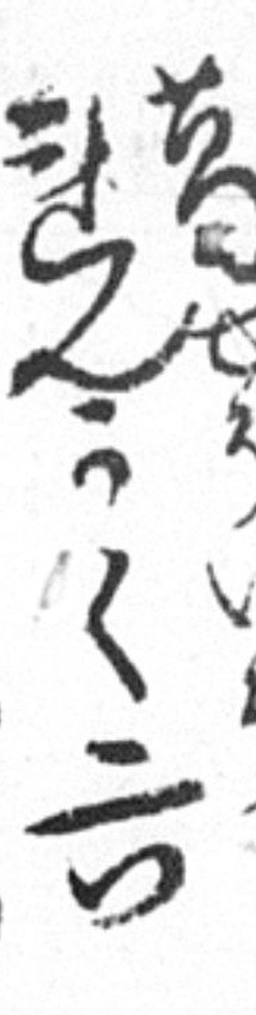れんかく二つ
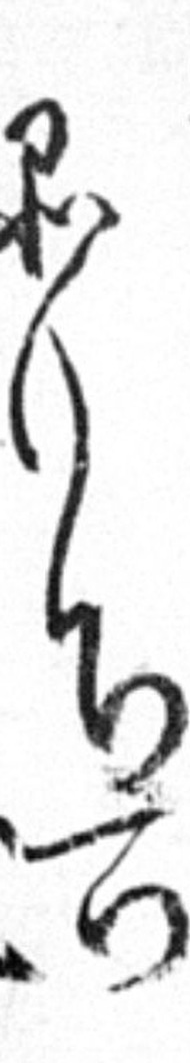品もち一つ
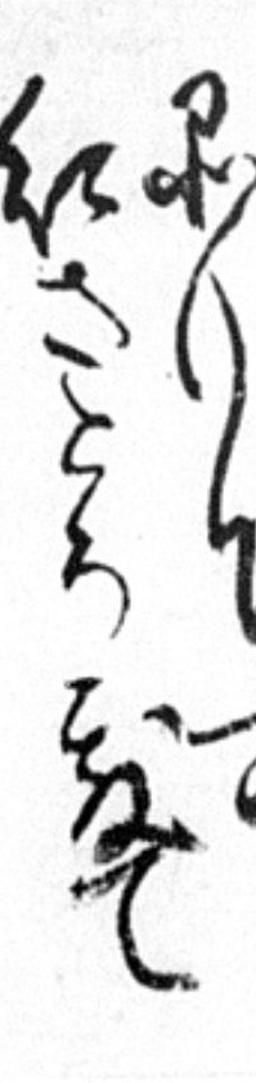紅さとう敷て

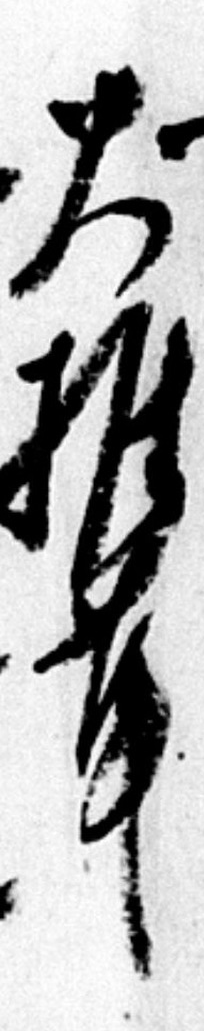大椎茸
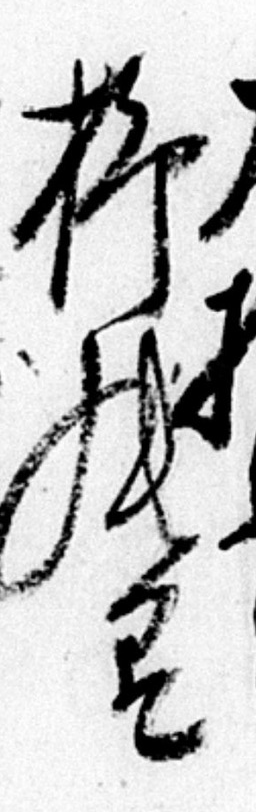柳のり
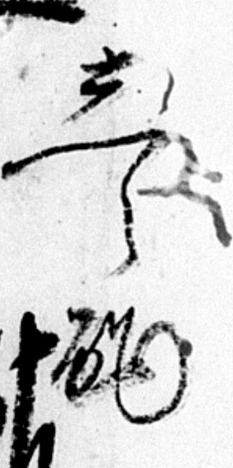しら酢
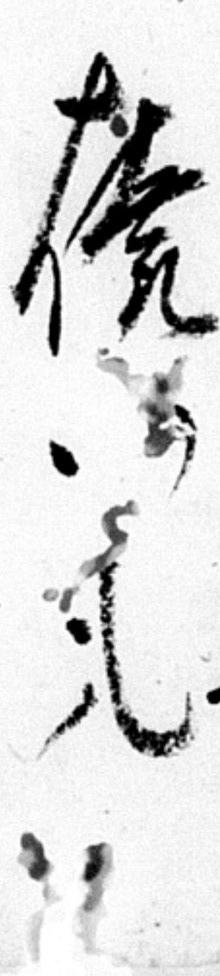焼いも
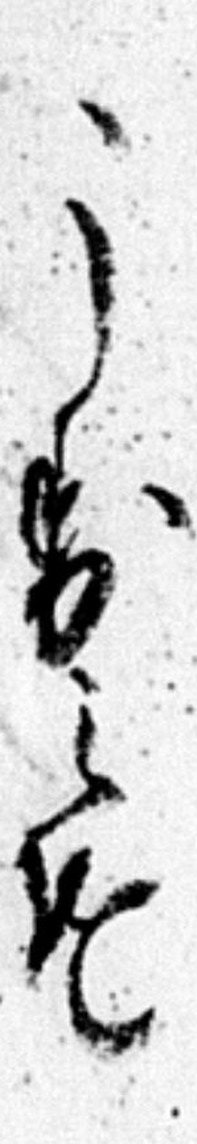うすみそ

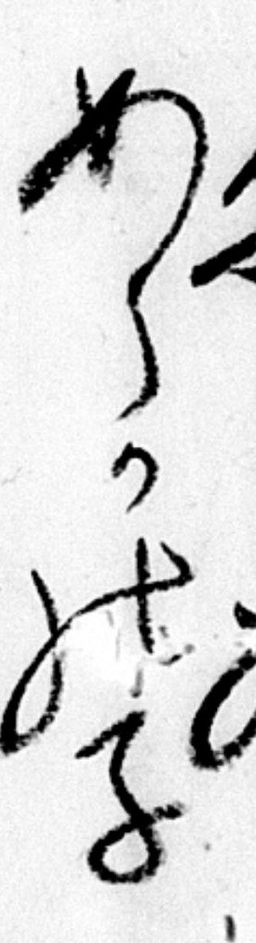めたかの子
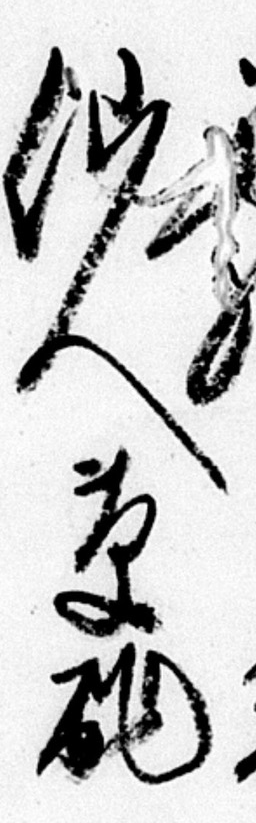仙人草酢

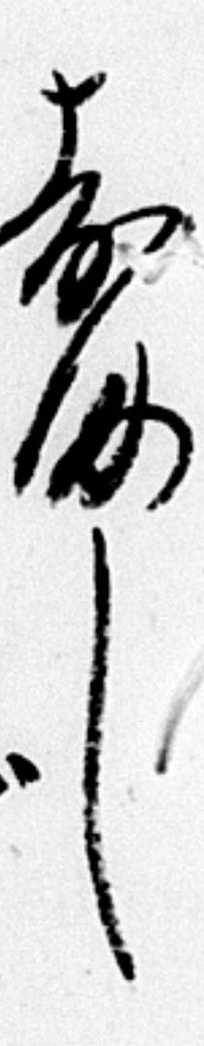すまし
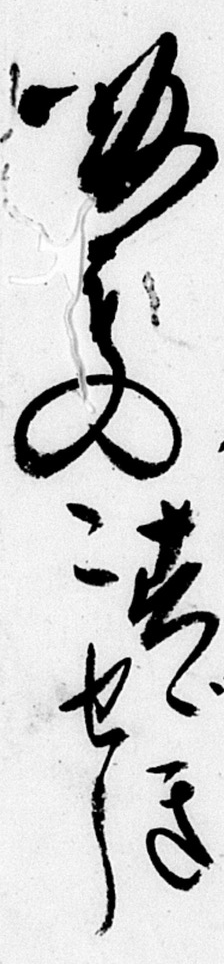吸ものすゞき
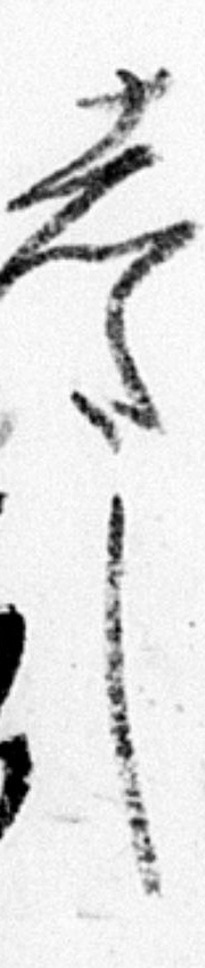したし
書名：（宝暦十年）卯月廿日献立
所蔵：徳島県立図書館
